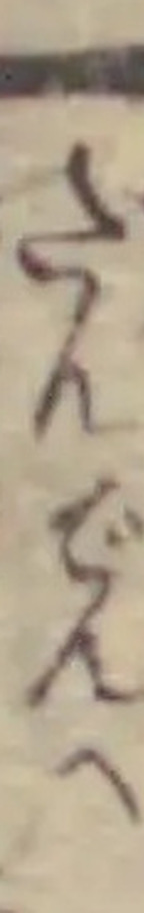たんでんへ
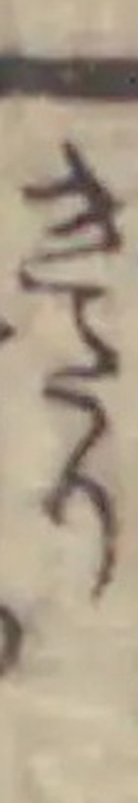きたり
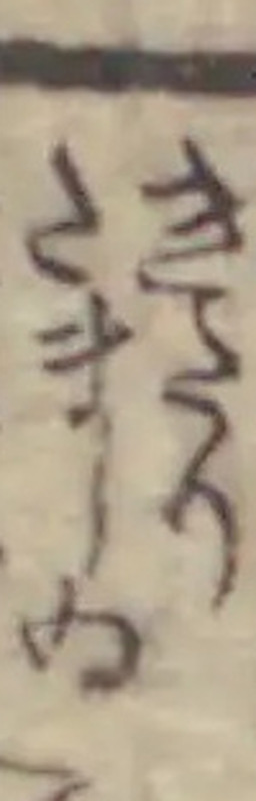たましゐ
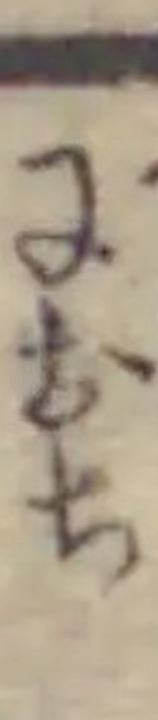におち
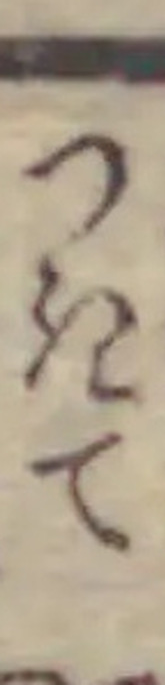つきて
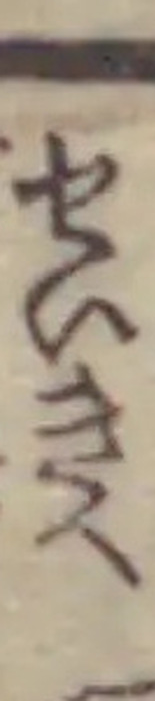せいきへ
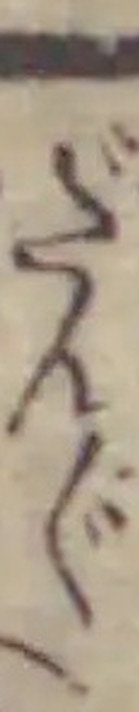だん〴〵
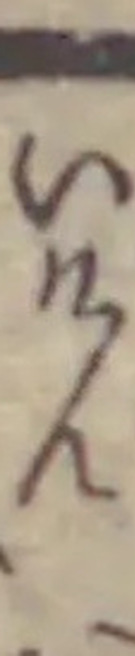いけん
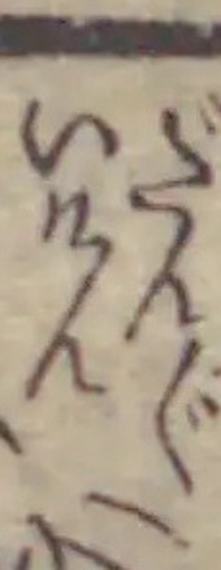いけん
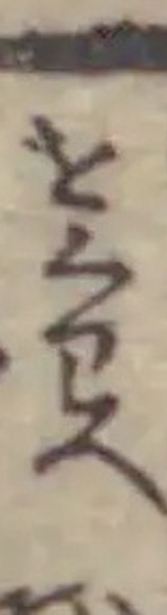をくわへ
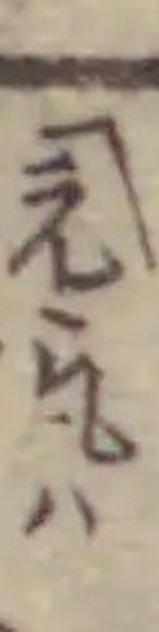〽元気は
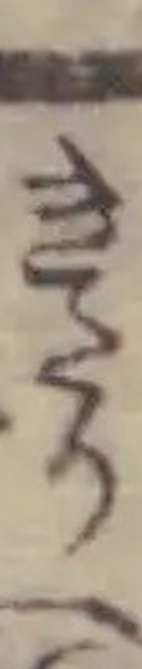きたり
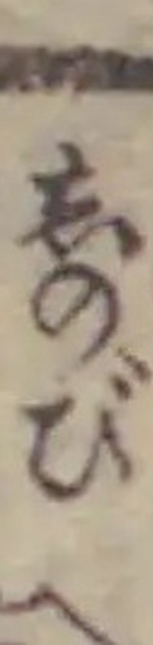しのび

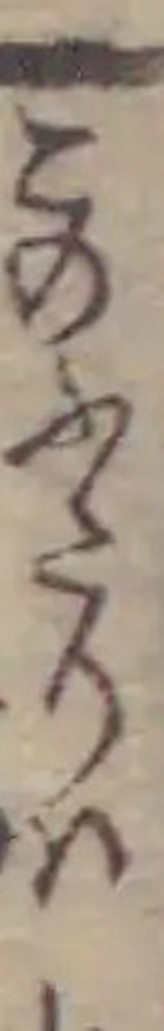このふたりは
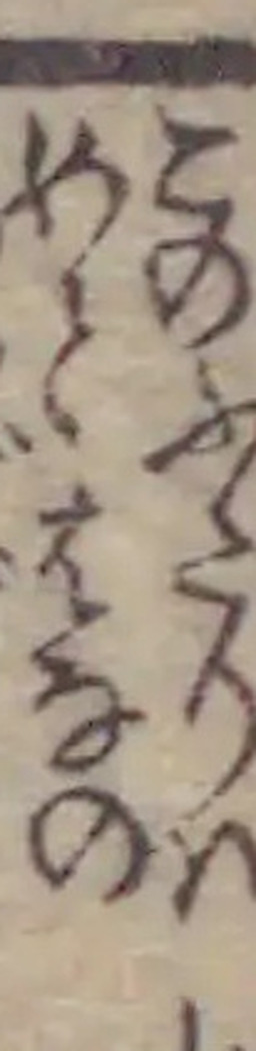めとはなの
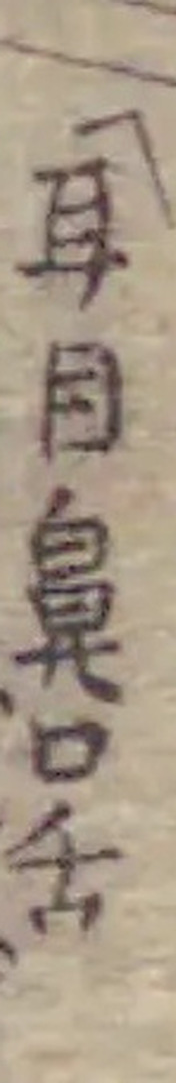〽耳目鼻口舌
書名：腹内養生主論 3巻
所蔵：国立国会図書館 National Diet Library, JAPAN
